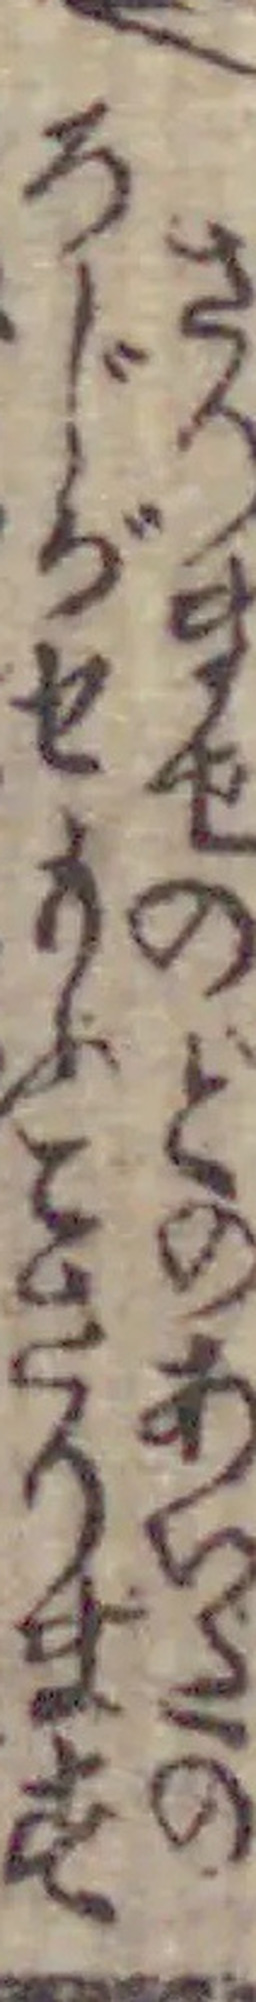ろじがせもふこさります
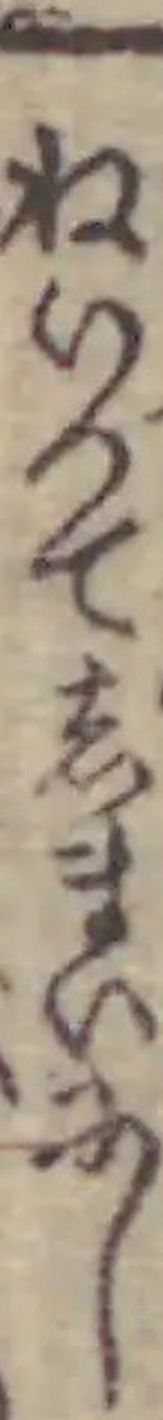ねいつてしまいにし
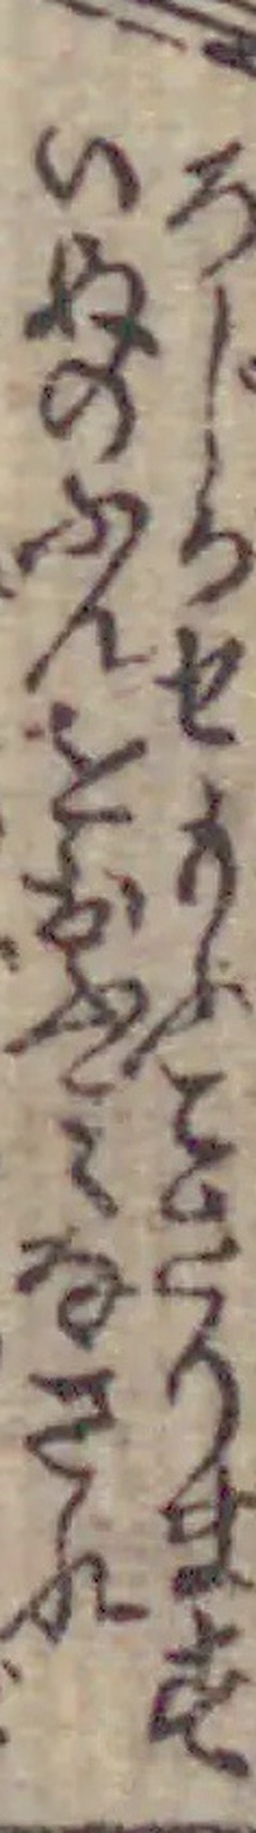いぬのふんをおふみなされ
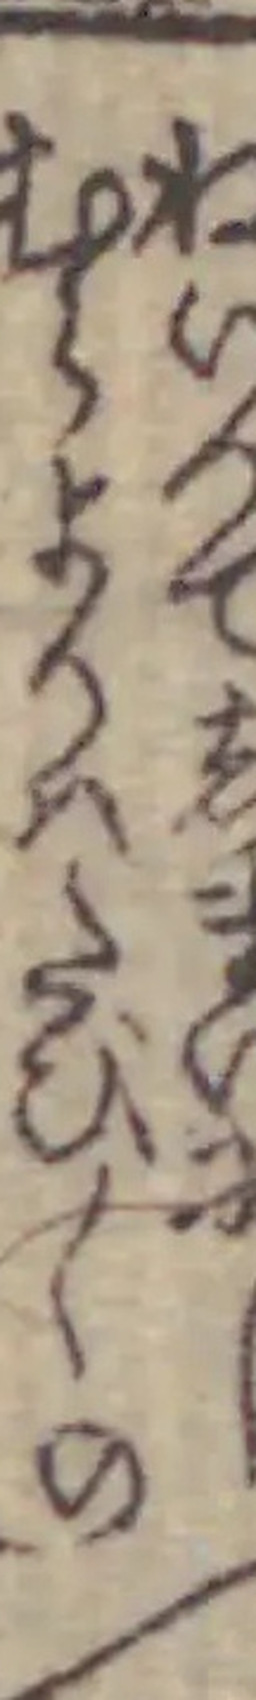むらよりはたび〳〵の
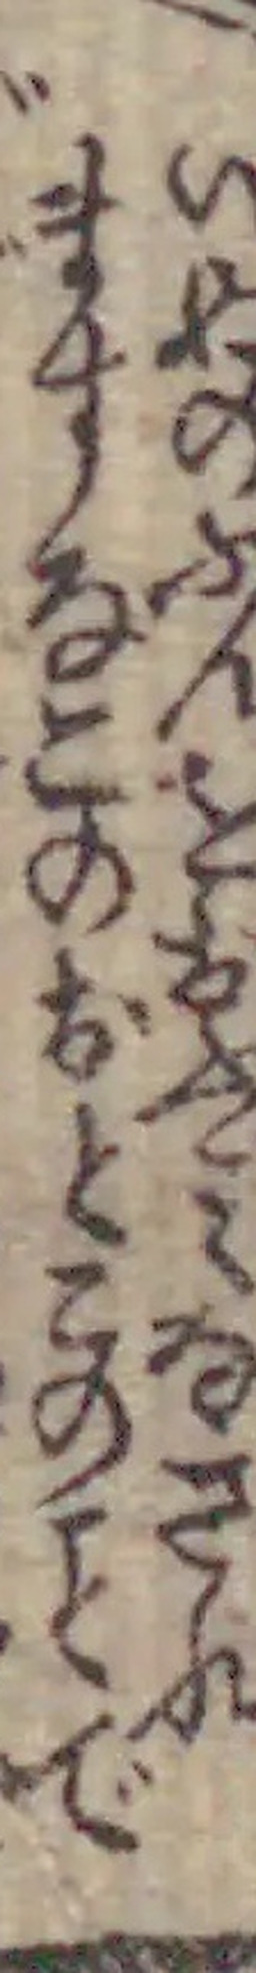ますなこのおとこのことで
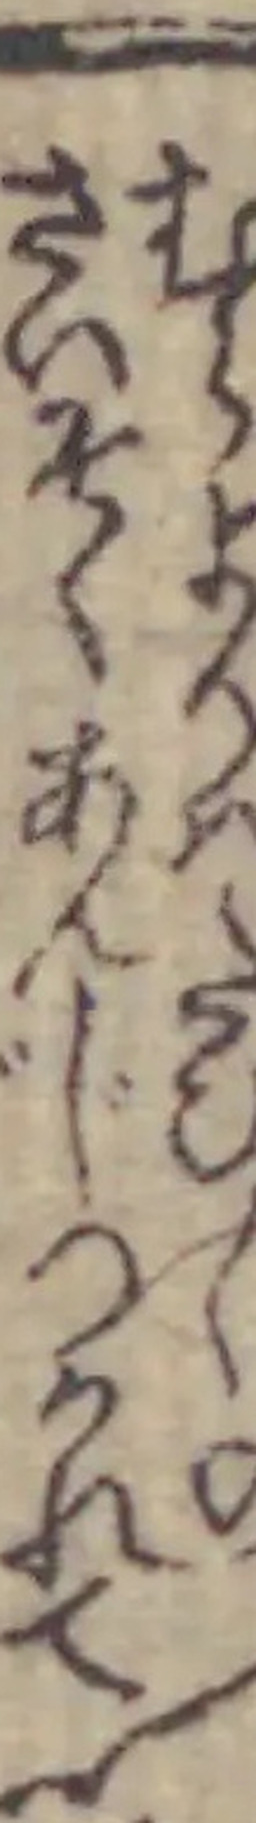さいそくあんじつかれて
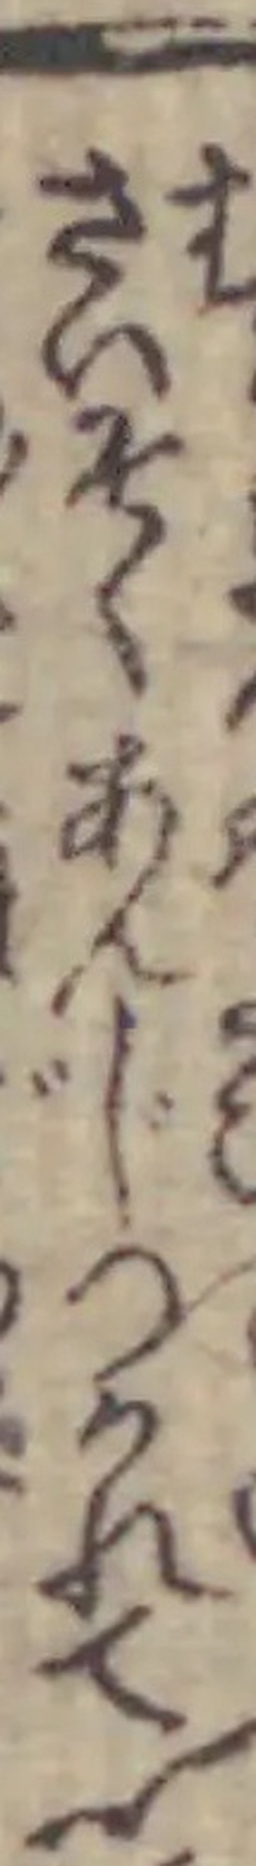さいそくあんじつかれて
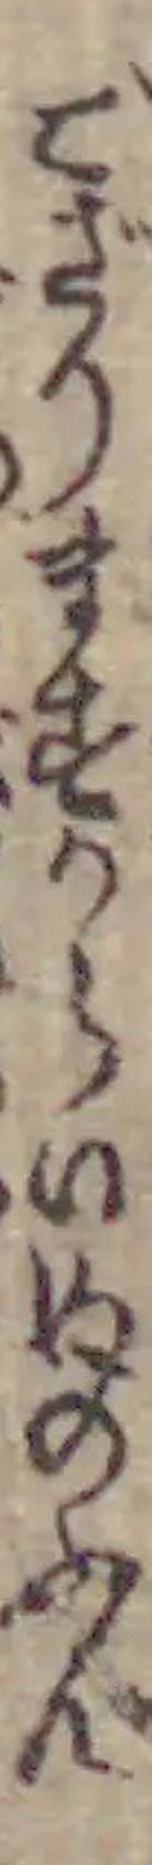ござりますからいぬのふん
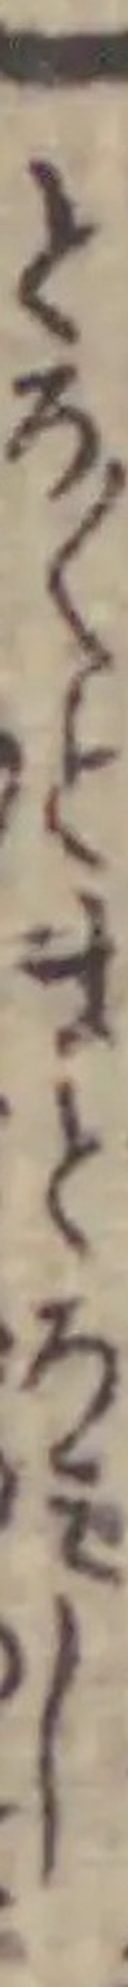とろ〳〵とまどろみし
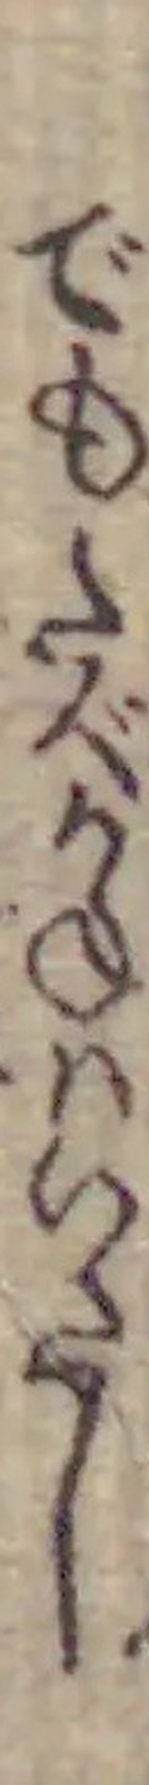でもたべかねはいたし
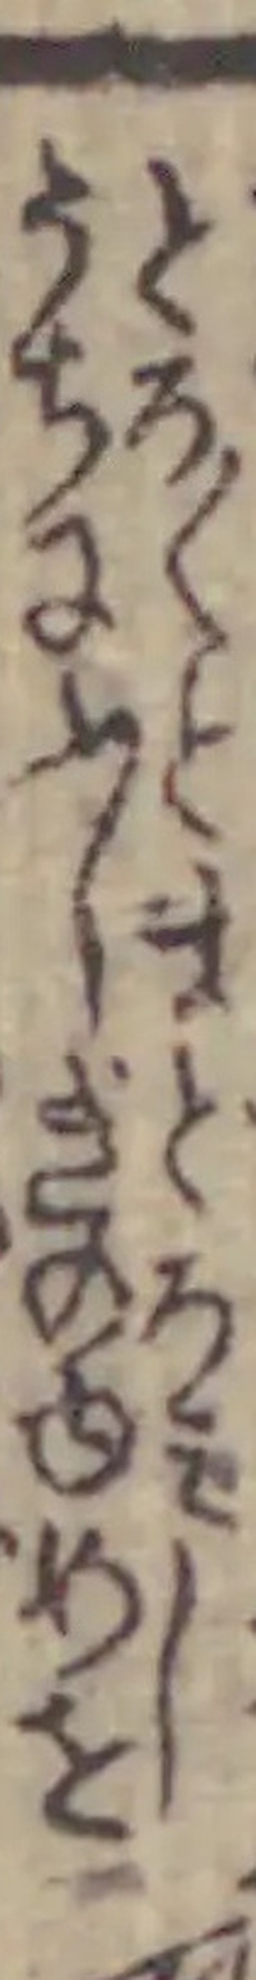うちにふしぎのゆめを
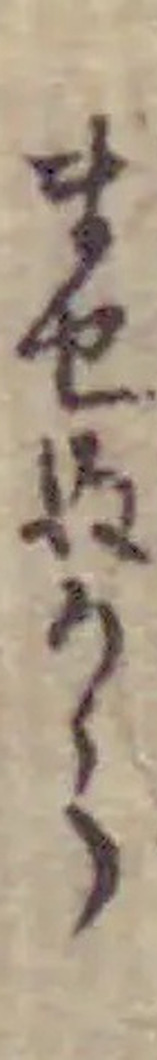ませぬから
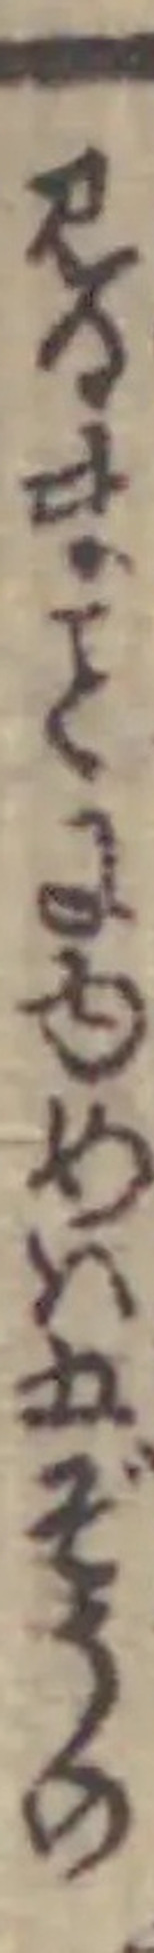見るまことにゆめは五ぞうの
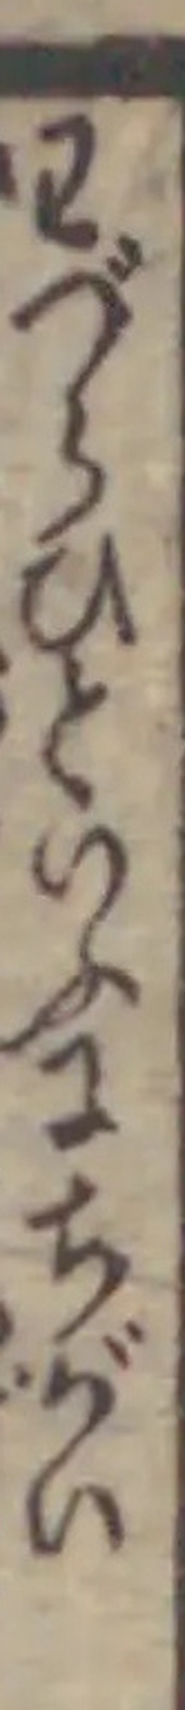わづらひといふにちがい
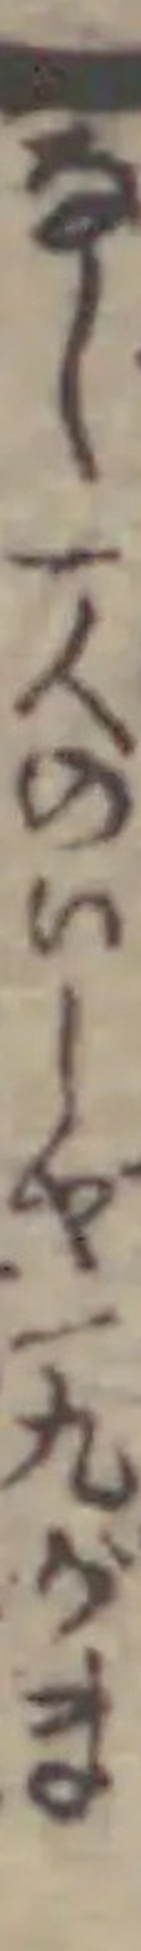なし一人のいしや一九がま
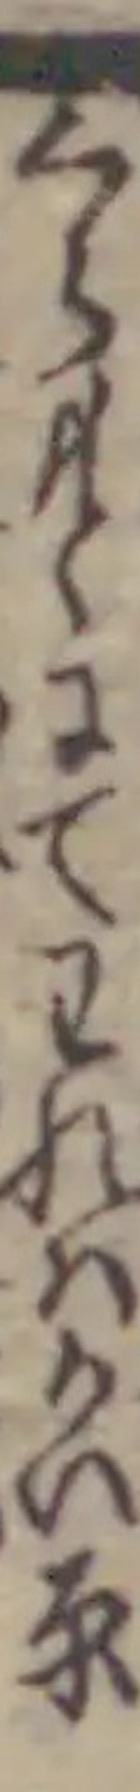くらもくにてわれはかい原
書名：腹内養生主論 3巻
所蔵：国立国会図書館 National Diet Library, JAPAN
